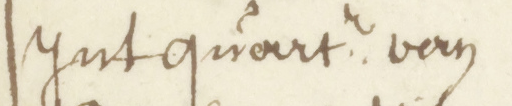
Int quartr van
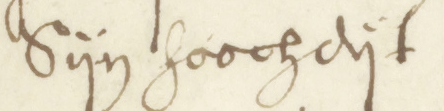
Sijn hoocheijt
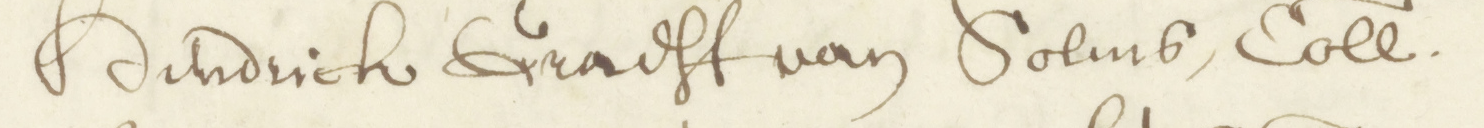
Hendrick Graeff van Solms, Coll.
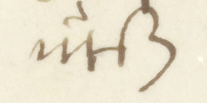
uts
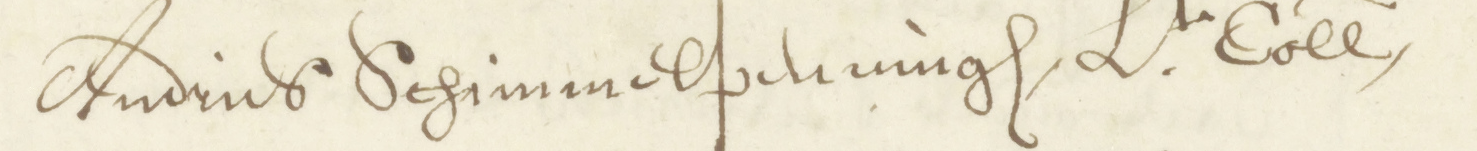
Andries Schimmelpenningh Lt. Coll,
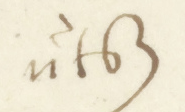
uts
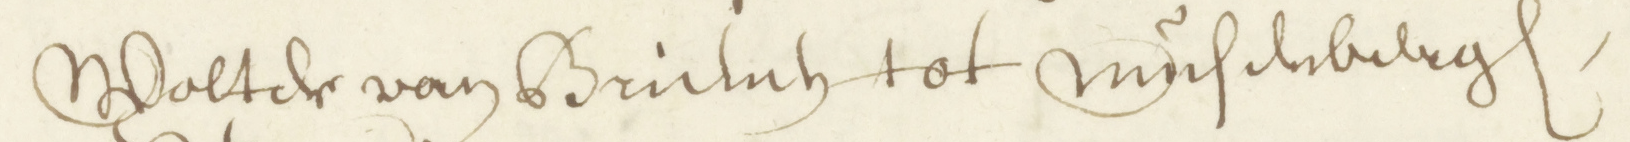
Wolter van Brienen tot Musenbergh,
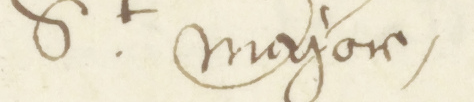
St. Major,
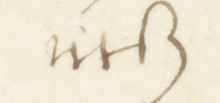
uts
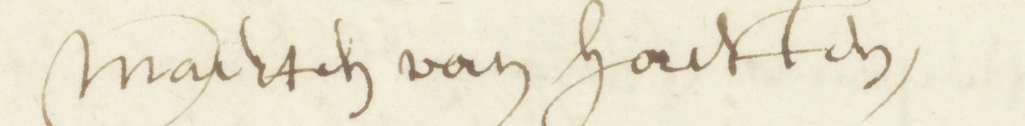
maerten van haesten
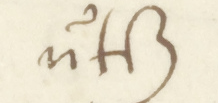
uts
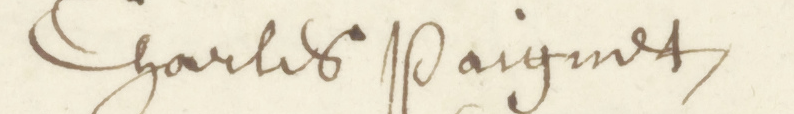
Charles Paignet,
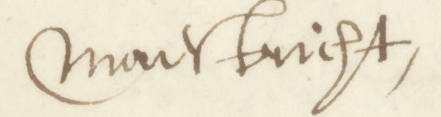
Maestricht,
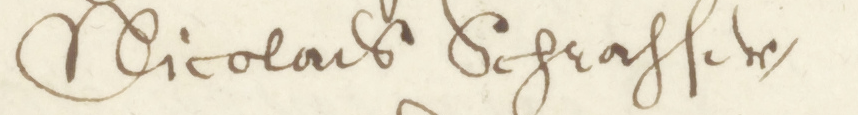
Nicolaes Schrasser,
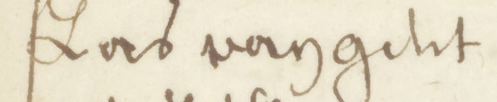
Zas van gent
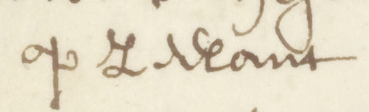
op Zeelant
